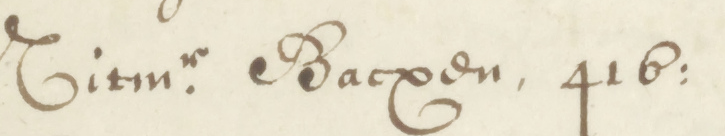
Ritmr. Bacxen, 416:
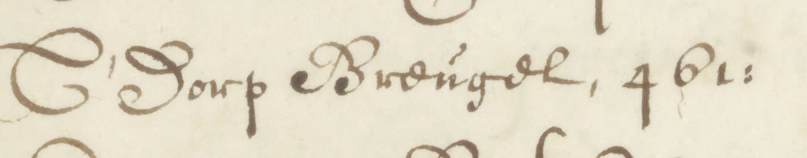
T‛Dorp Breugel, 461:
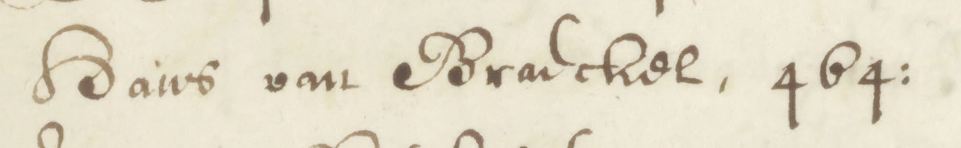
Hans van Braeckel, 464:
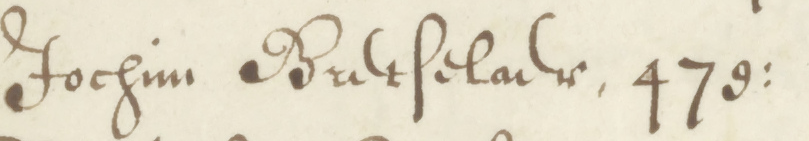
Jochim Bretselaer, 479:
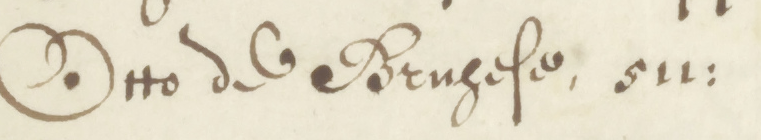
Otto de Bruhese, 511:
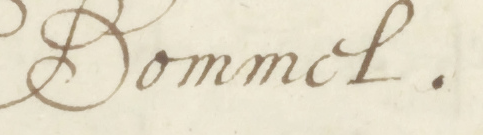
Bommel.
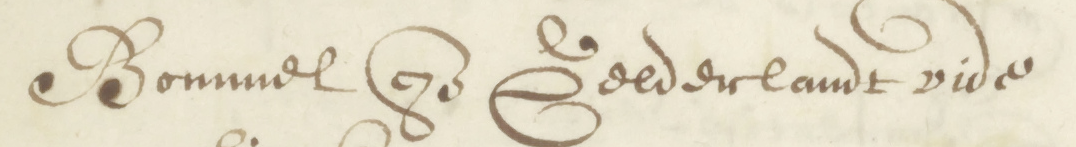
Bommel ca. Gelderlandt vide
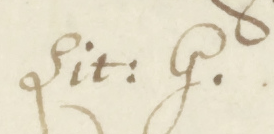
Lit: G.
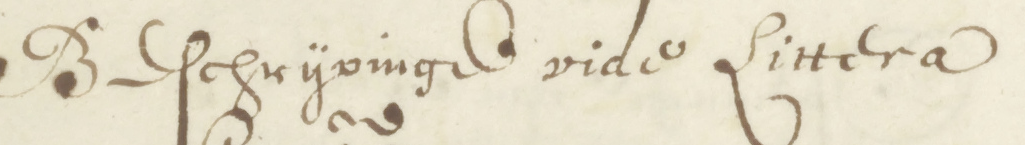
Beschrijvinge vide Littera
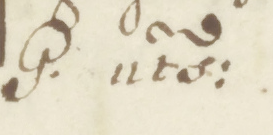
P. uts:
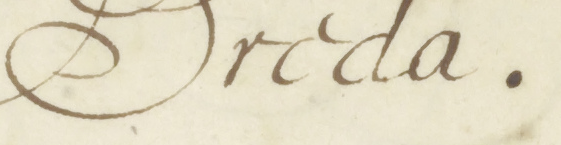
Breda.
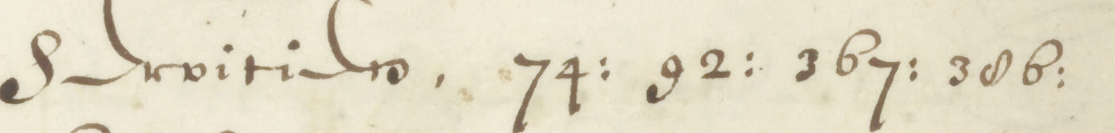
Servitien, 74: 92: 367: 386:
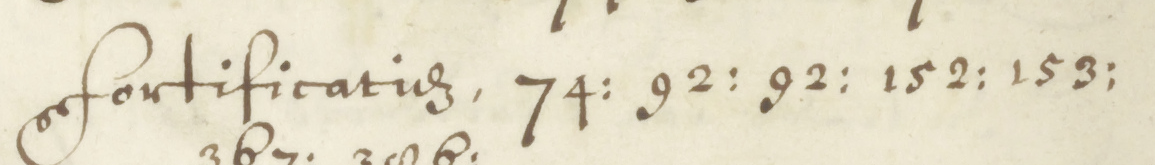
Fortificatien, 74: 92: 92: 152: 153:
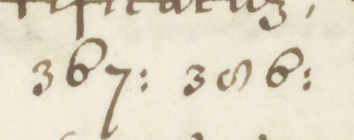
367: 386:
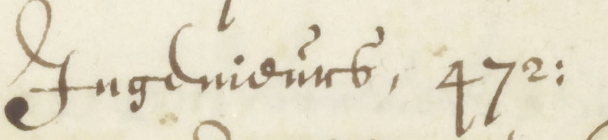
Ingenieurs, 472:
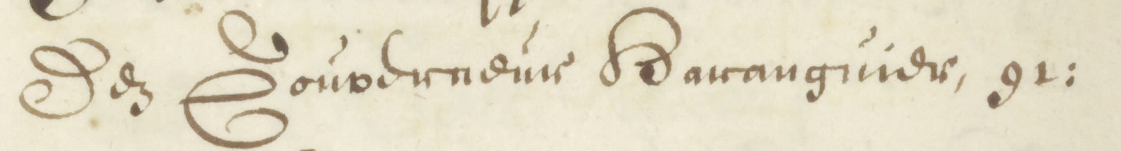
Den Gouverneur Haranguier, 91:
